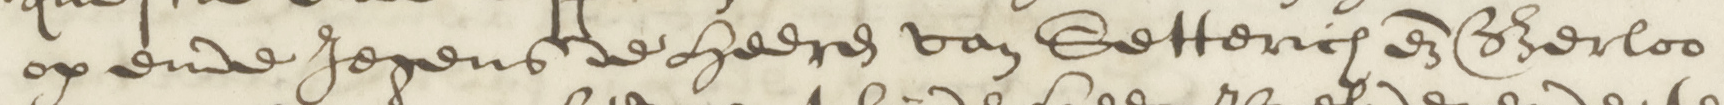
op ende Jegens de heeren van Setterich en Berloo.
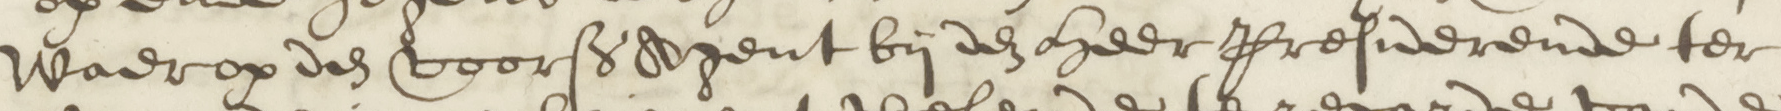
Waerop den voorsz Agent bij den heer presiderende ter
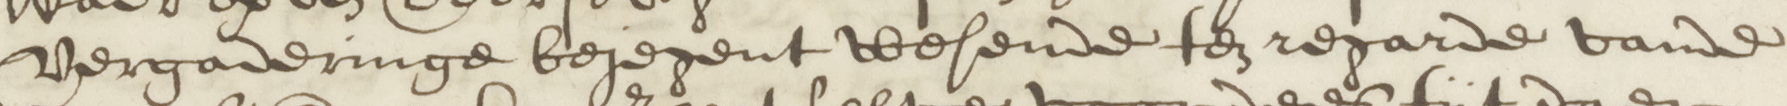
vergaderinge bejegent wesende ten regarde vande
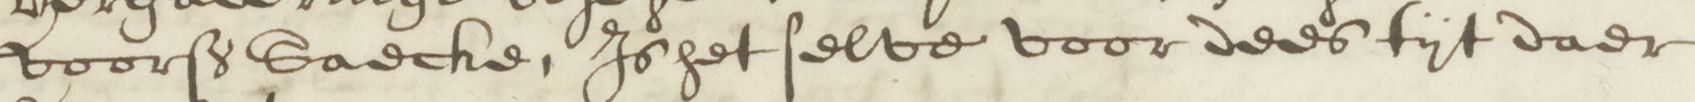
voorsz Saecke, Is het selve voor dees tijt daer
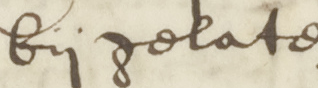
bij gelaten.
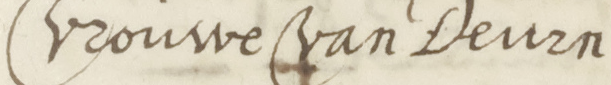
Vrouwe van Deurn
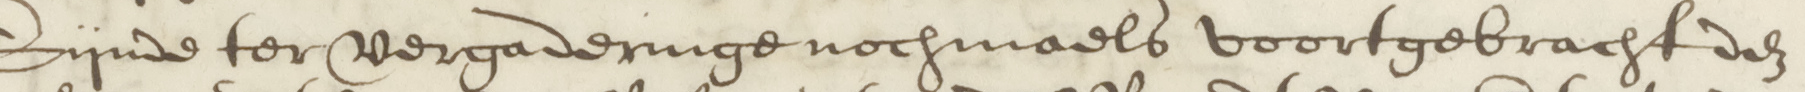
Sijnde ter vergaderinge nochmaels voortgebracht den
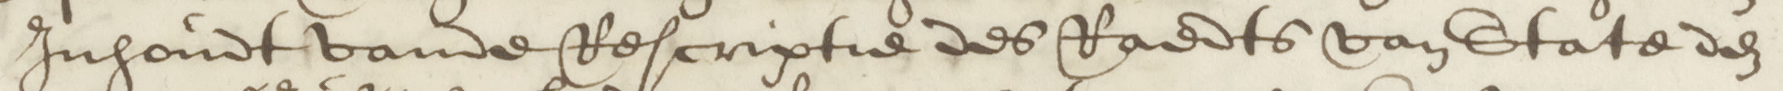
Inhoudt vande Rescriptie de Raedts van State den
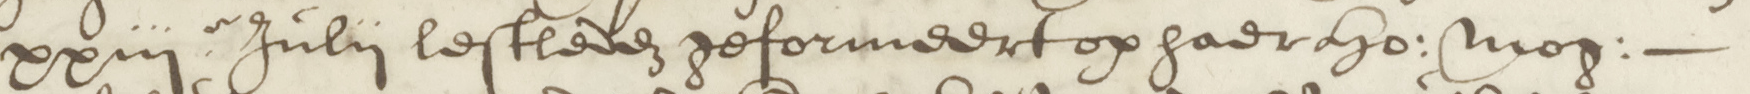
xxiiie Julij lestleden geformeert op haer Ho:Mo: —
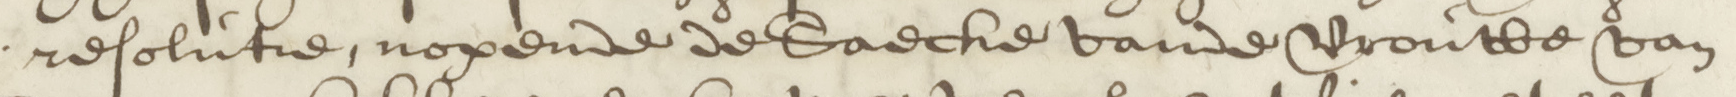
resolutie, nopende de Saecke vande Vrouwe van
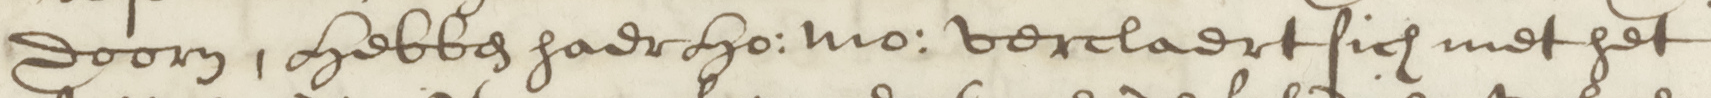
Doorn, hebben haer Ho:Mo: verclaert sich met het
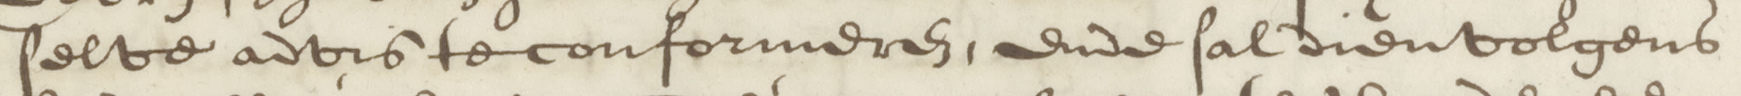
selve advis te conformeren, ende sal dienvolgens
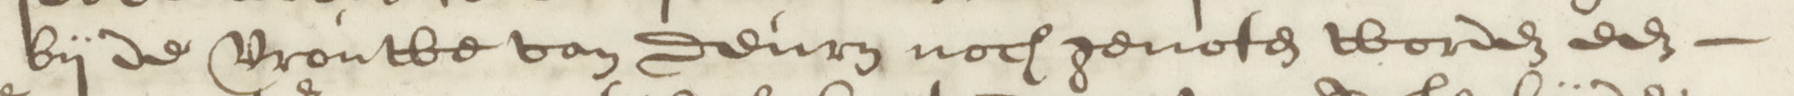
bij de Vrouwe van Deurn noch genoten worden een —
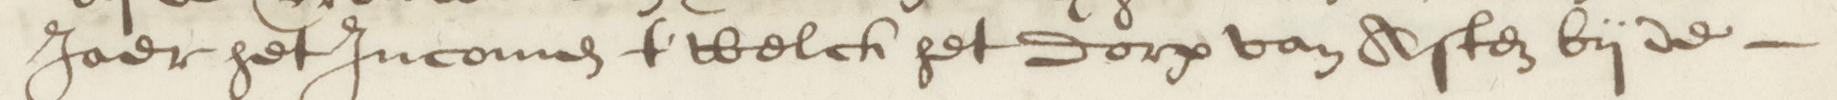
Jaer het Incomen t'welck het dorp van Asten bij de —
